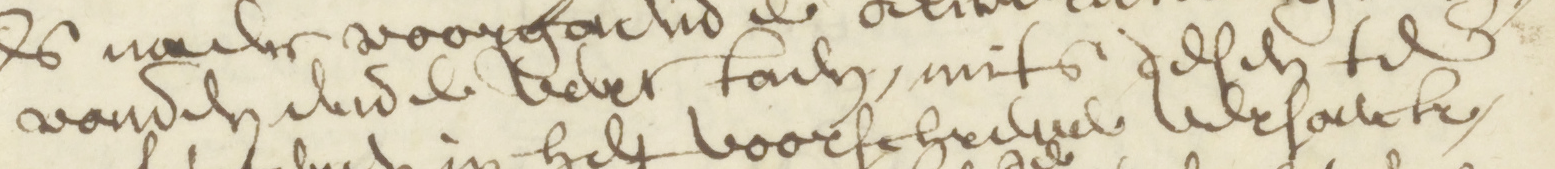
vonden ende verstaen, mits desen te
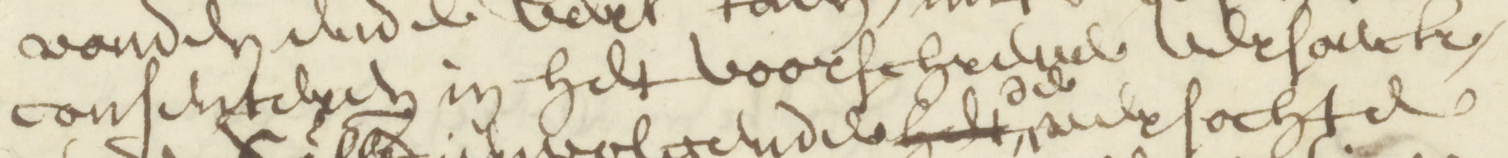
consenteren in het voorschreve versoeck„
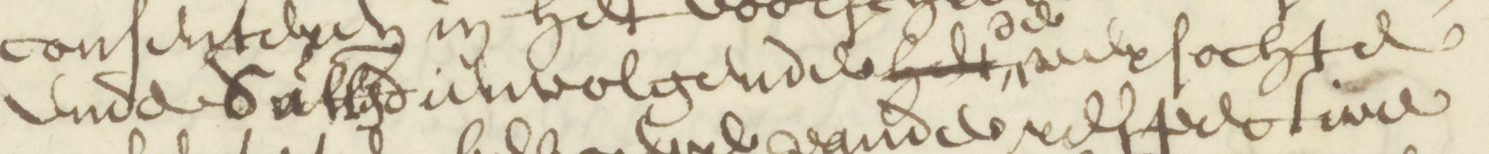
ende sullen dienvolgende het,, de versochte
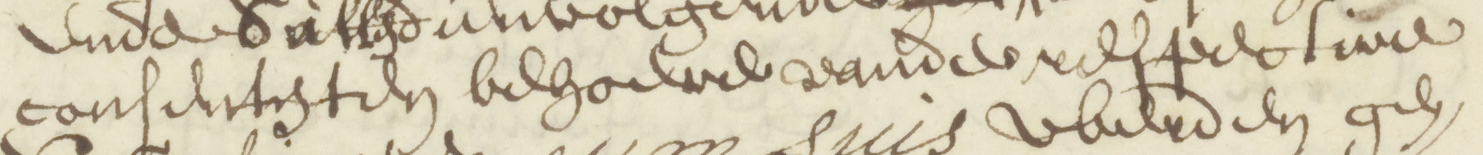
consenten ten behoeve vande respective
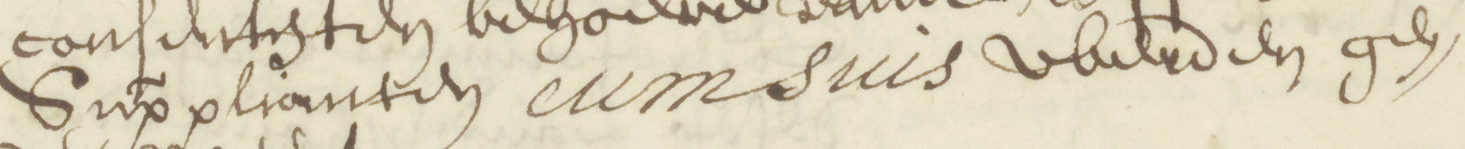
Supplianten cum suis werden ge,,
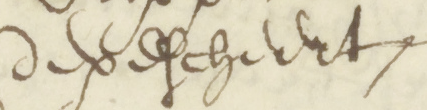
depescheert.
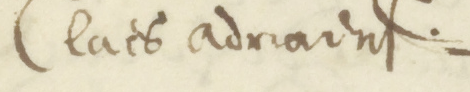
Claes adriaens
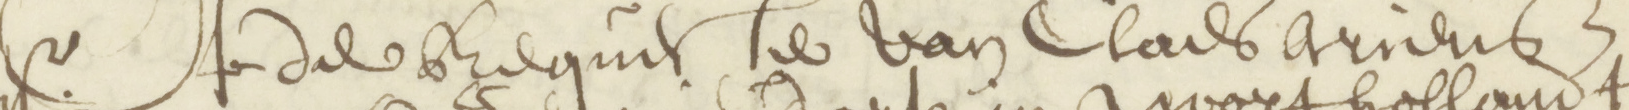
Op de requeste van Claes Ariens
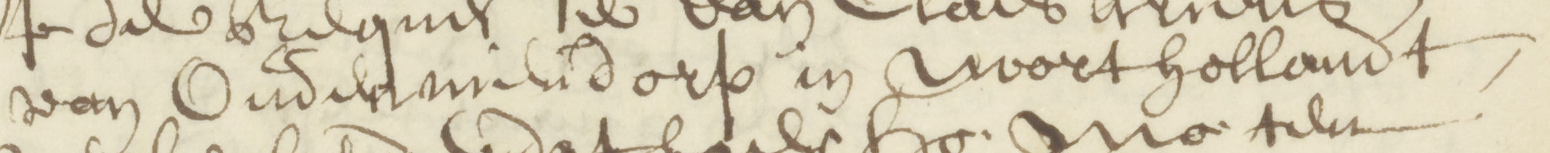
van Ouden nieudorp in Noorthollandt
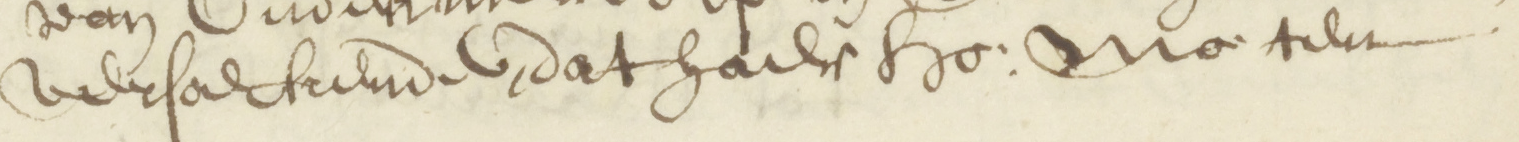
versoeckende, dat haer Ho:Mo: ten
